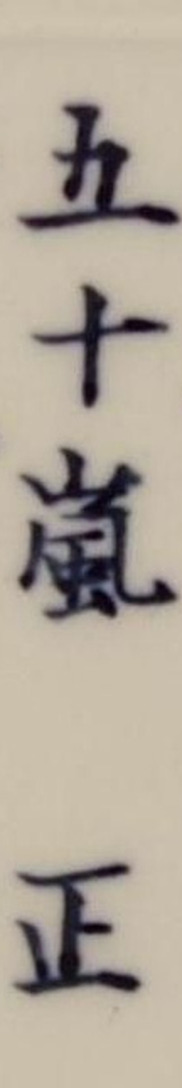五十嵐正
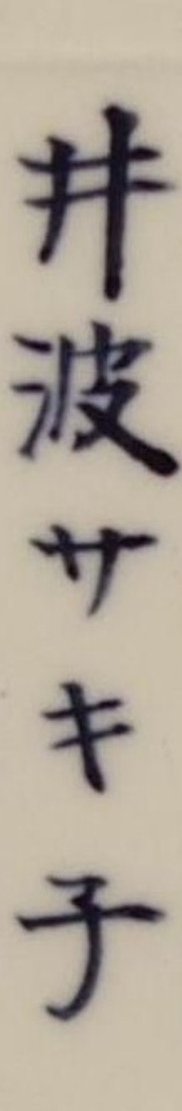井波サキ子
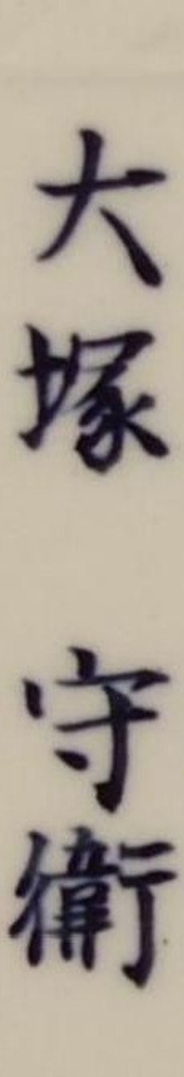大塚守衛
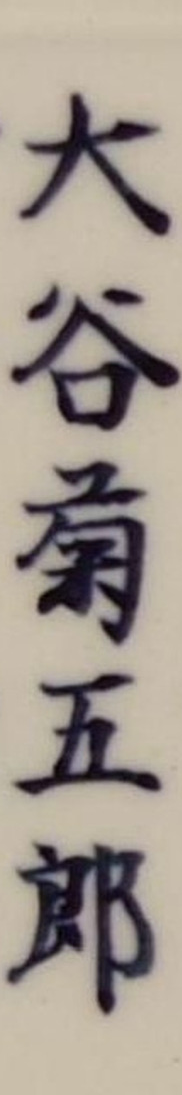大谷菊五郎
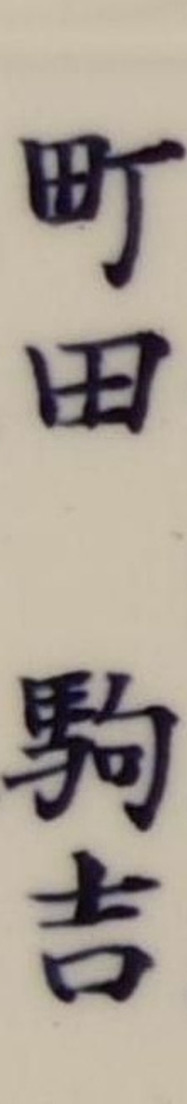町田駒吉
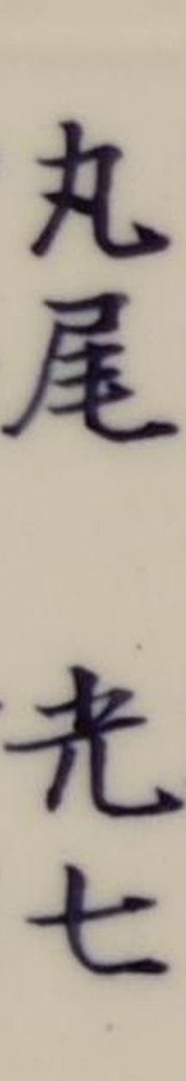丸尾光七
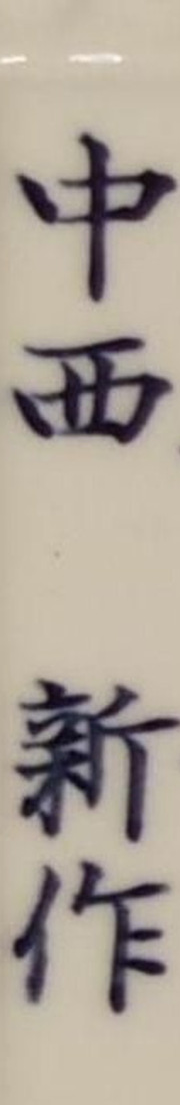中西新作

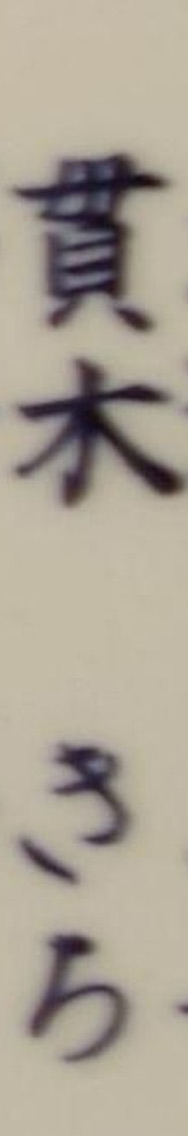貫木きち
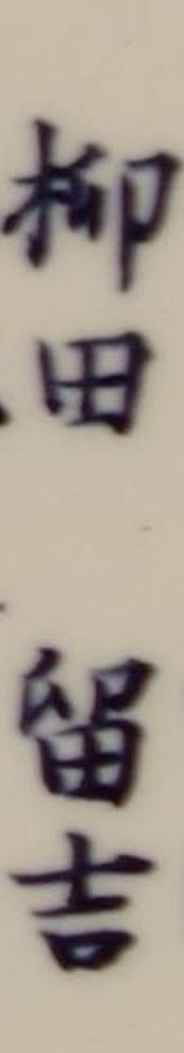柳田留吉
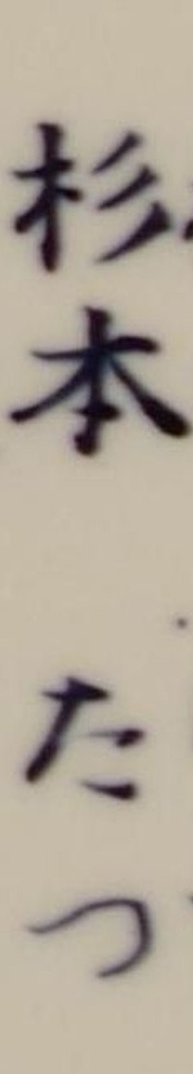杉本たつ
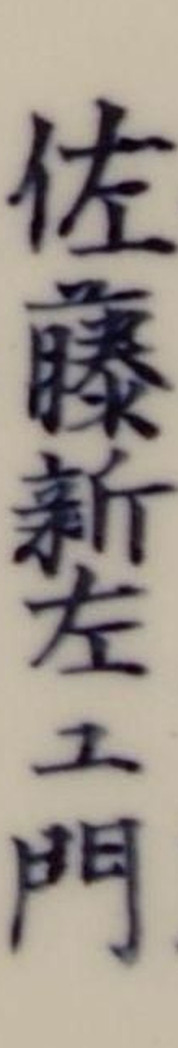佐藤新左ェ門
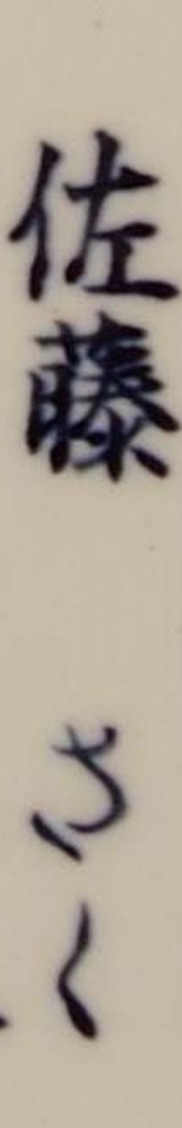佐藤さく
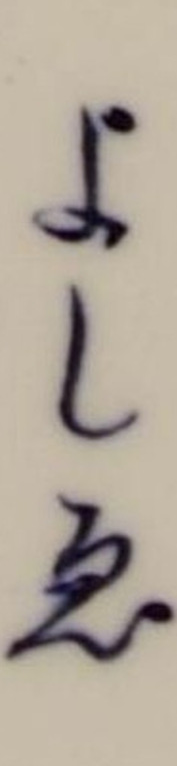よしゑ
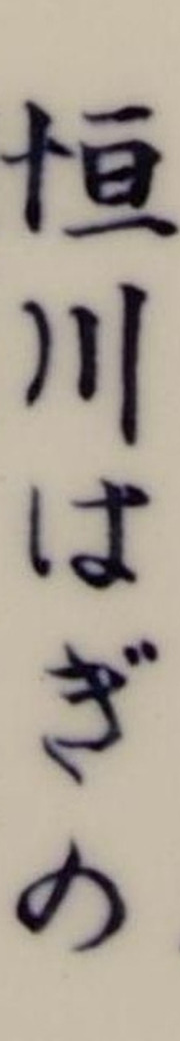恒川はぎの
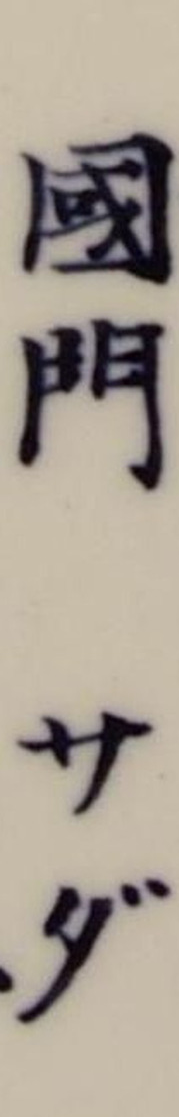国門サダ
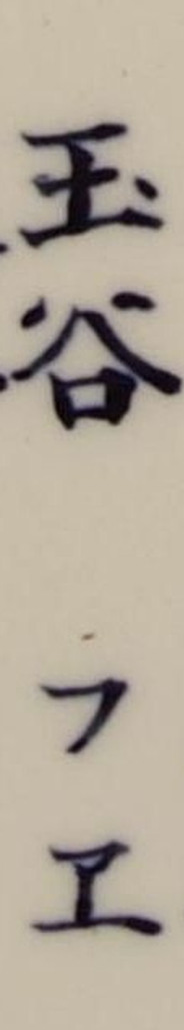玉谷フヱ
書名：M~S
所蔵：高野山金剛峯寺
